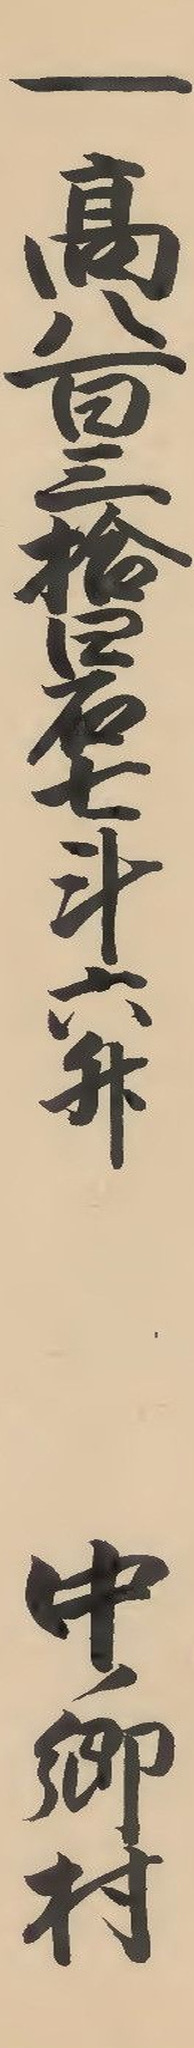一高八百三拾四石七斗六升中ノ郷村
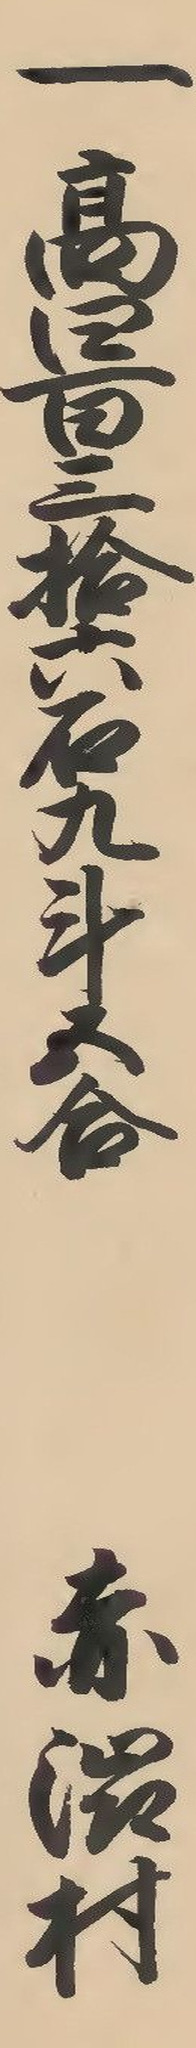一高四百三拾六石九斗五合赤渋村
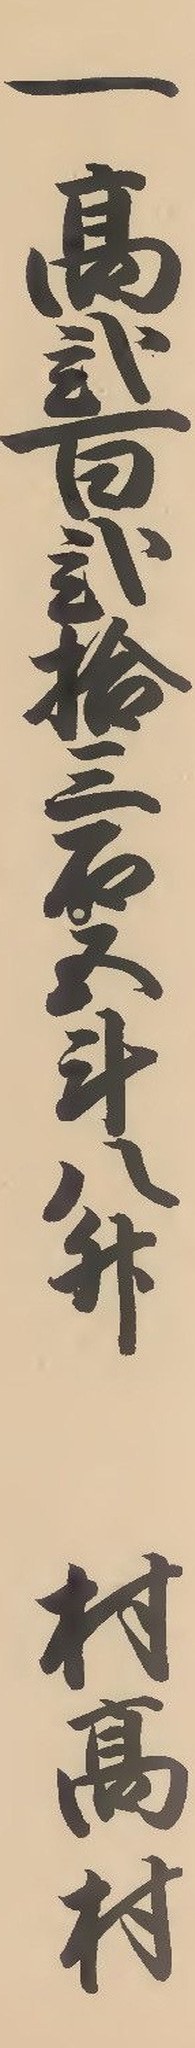一高弐百弐拾三石五斗八升村高村
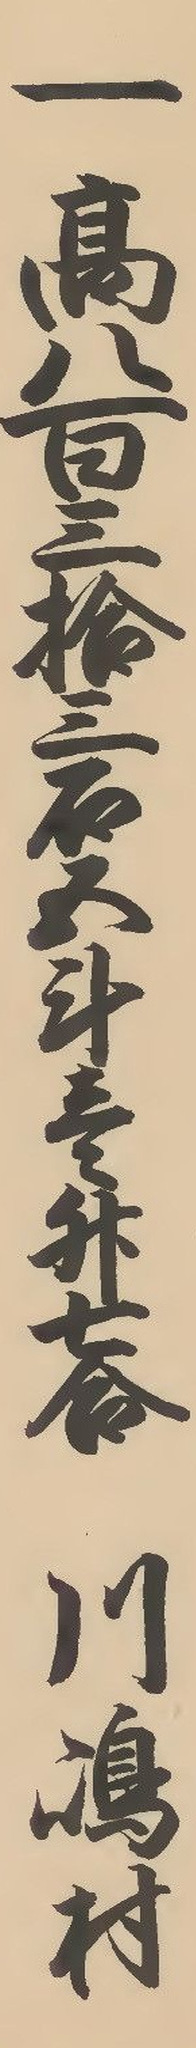一高八百三拾三石五斗壱升七合川島村
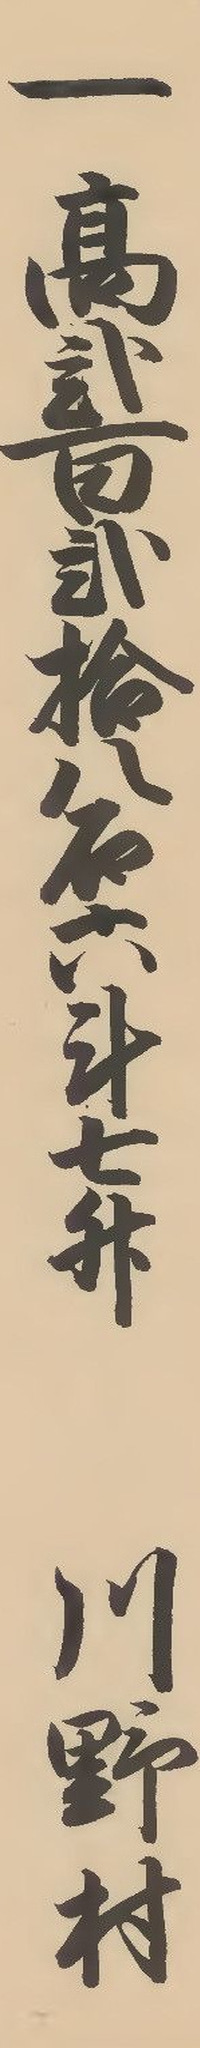一高弐百弐拾八石六斗七升川野村
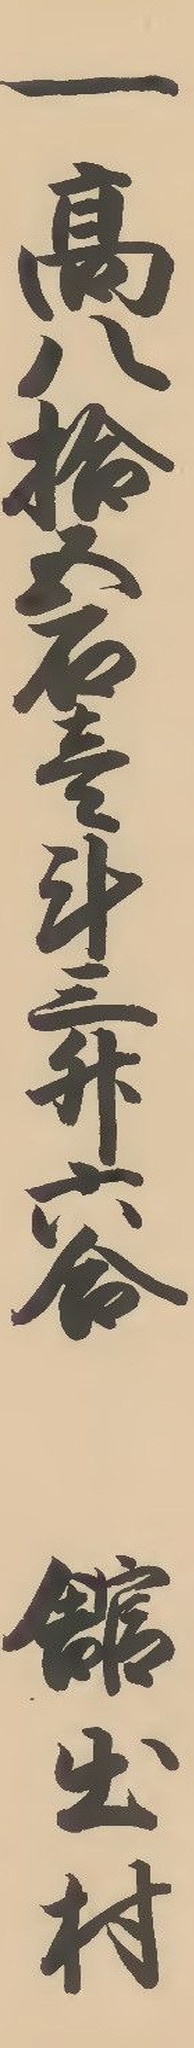一高八拾五石壱斗三升六合館出村

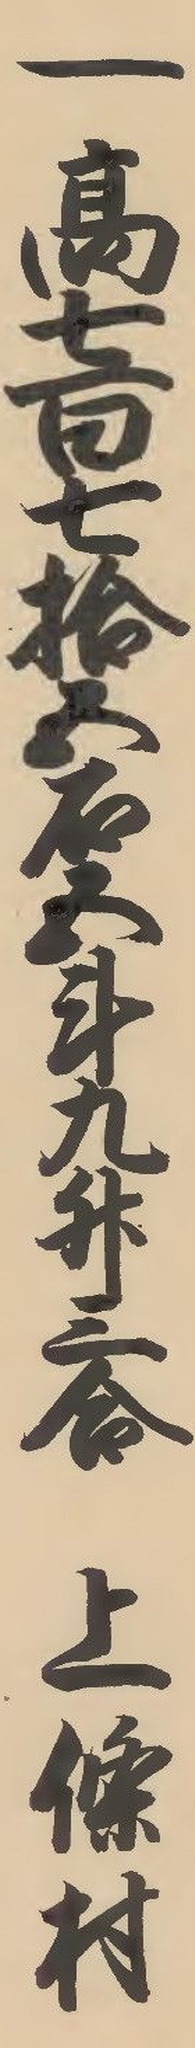一高七百七拾五石五斗九升三合上条村
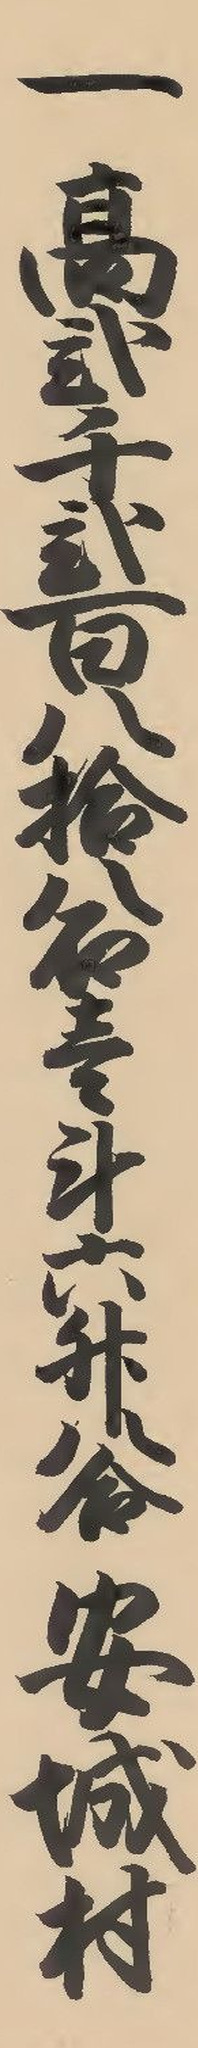一高弐千弐百八拾八石壱斗六升八合安城村
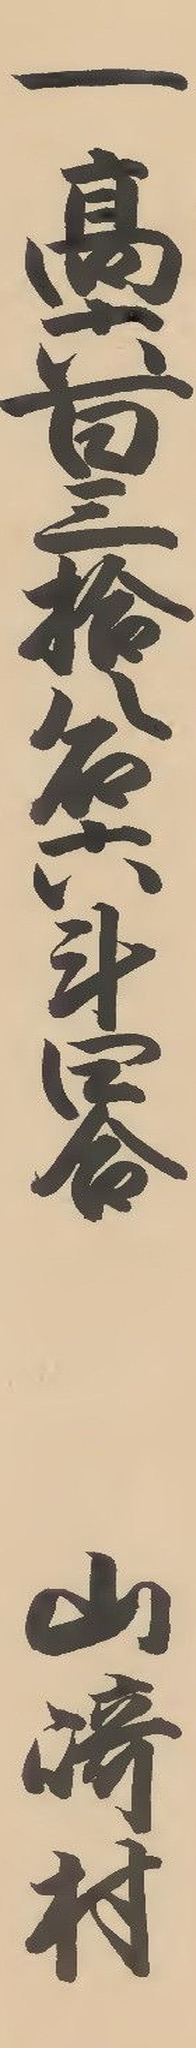一高六百三拾八石六斗四合山崎村
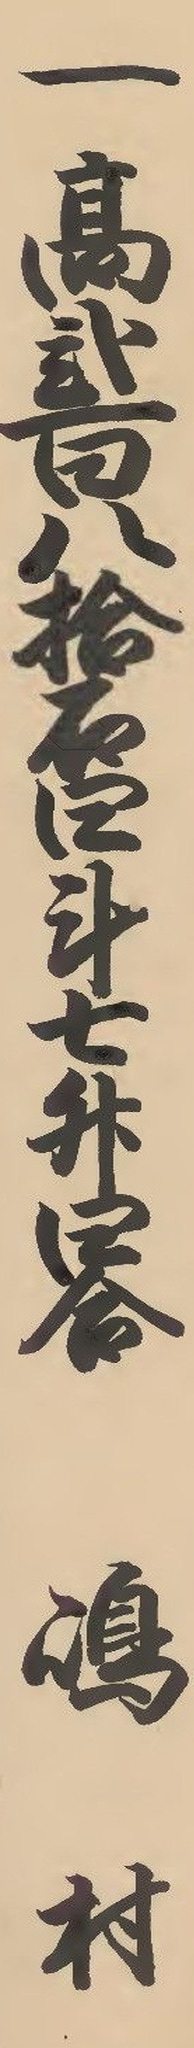一高弐百八拾石四斗七升四合島村
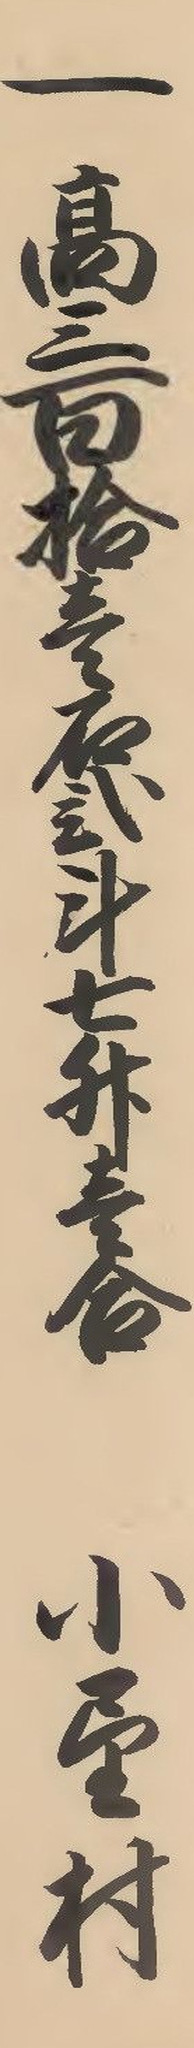一高三百拾壱石弐斗七升壱合小望村
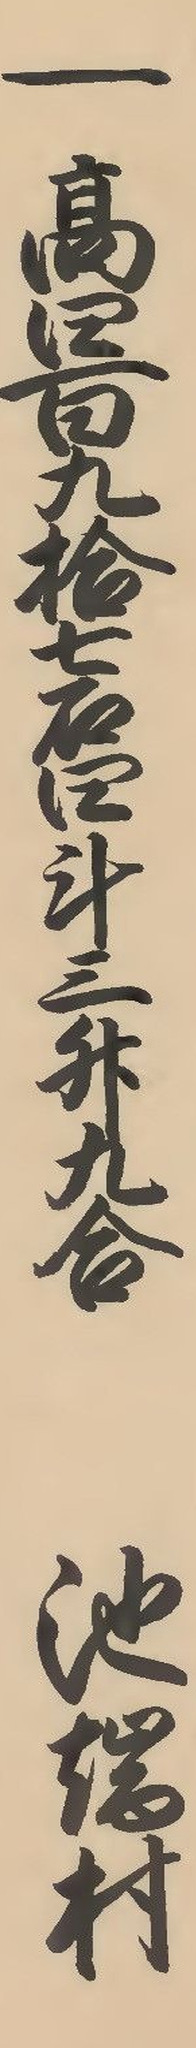一高四百九拾七石四斗三升九合池端村
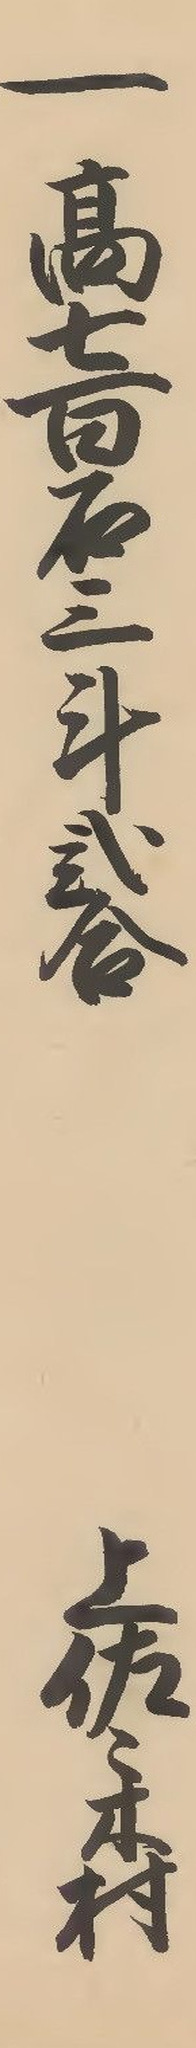一高七百石三斗弐合上佐々木村
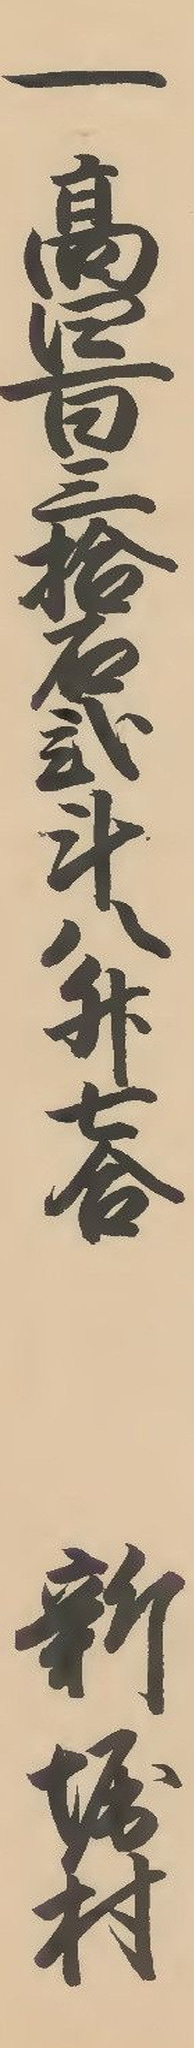一高四百三拾石弐斗八升七合新堀村

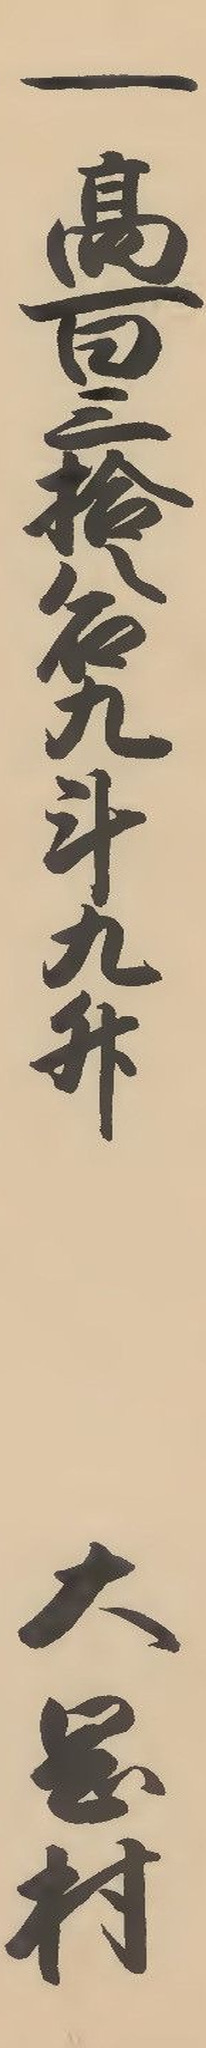一高百三拾八石九斗九升大岡村
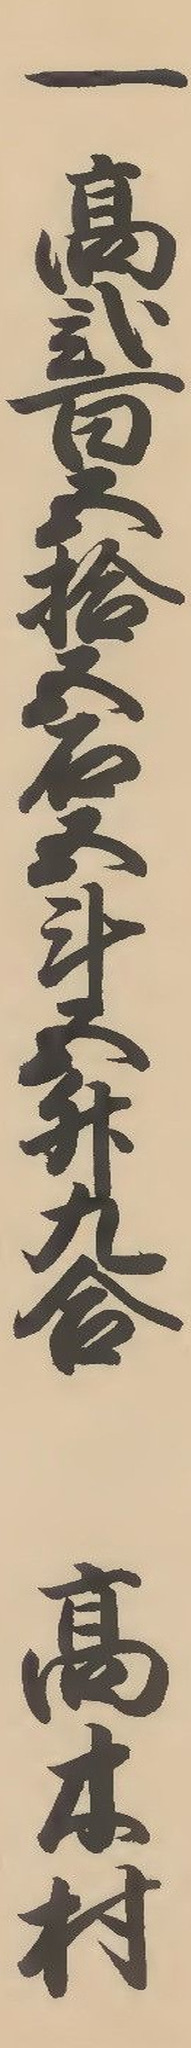一高弐百五拾五石五斗五升九合高木村
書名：三河国郷帳
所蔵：国立公文書館 National Archives of Japan
